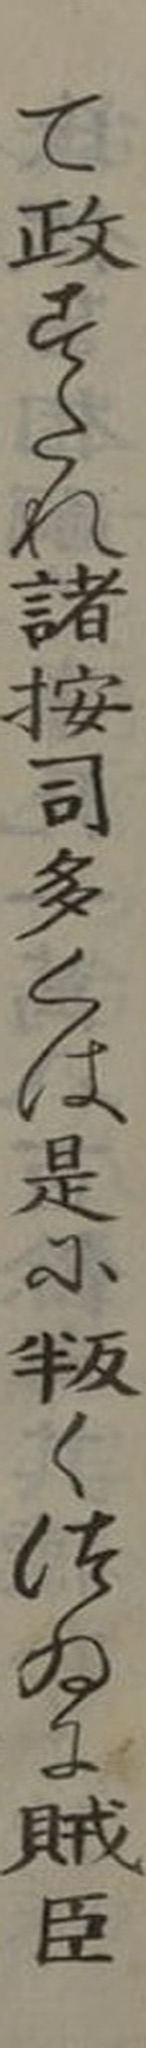て政すたれ諸按司多くは是に叛くつゐに賊臣
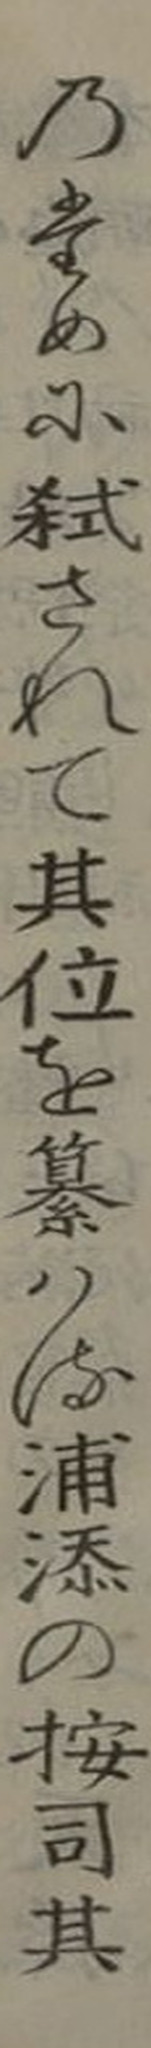のために弑されて其位を簒はる浦添の按司其
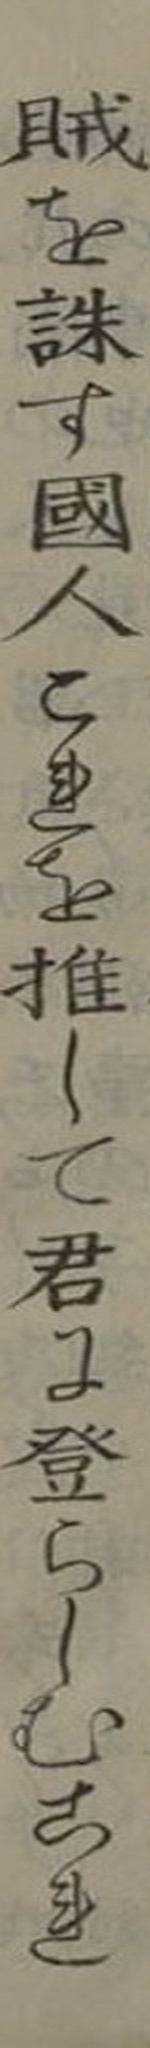賊を誅す國人これを推して君に登らしむこれ
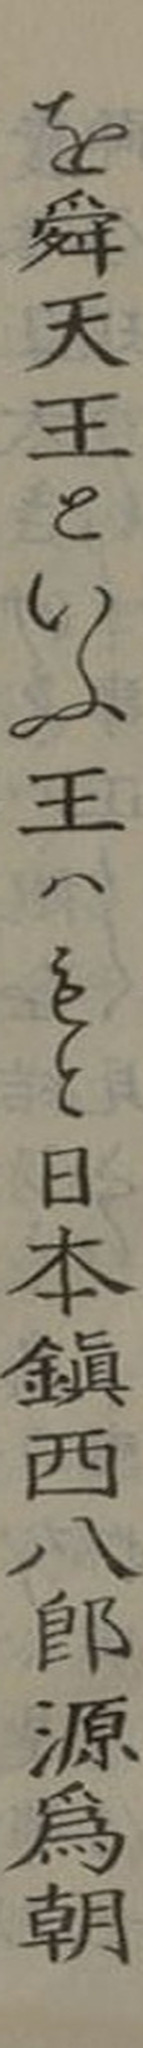を舜天王といふ王はもと日本鎮西八郎源爲朝
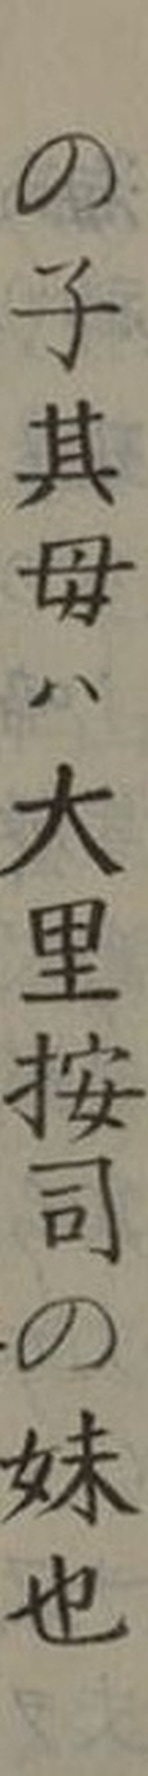の子其母は大里按司の妹也
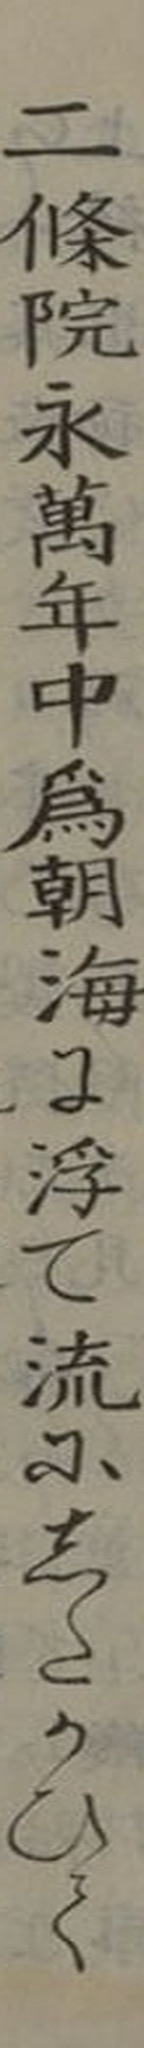二條院永萬年中爲朝海に浮て流にしたかいて
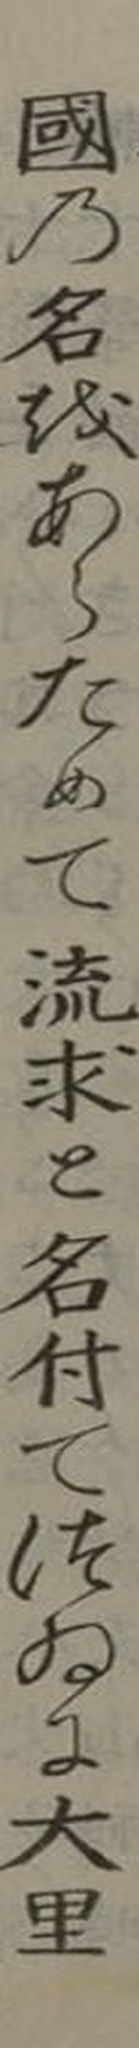國の名をあらためて流求と名付てつゐに大里
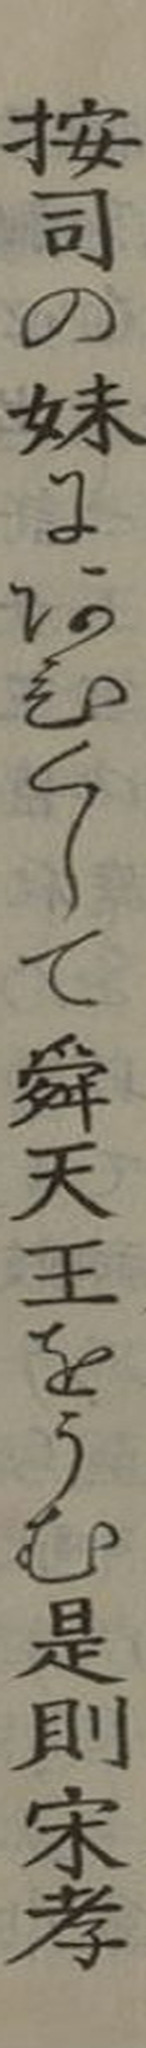按司の妹にあひたして舜天王をうむ是則宗孝
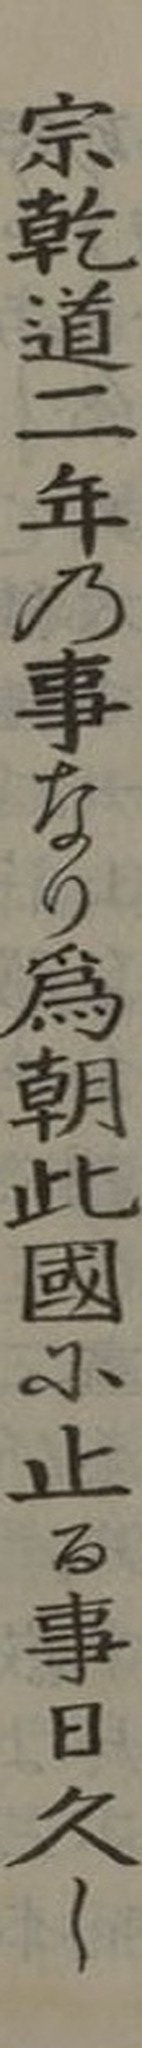宗乾道二年の事なり爲朝此國に止る事日久し
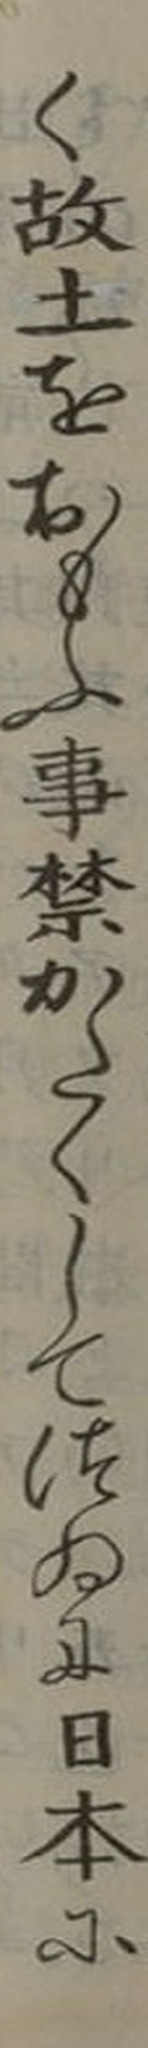く故土をおもふ事禁かたくしてつゐに日本に
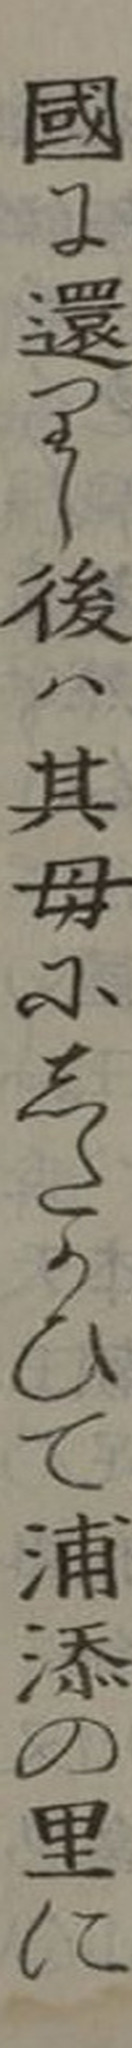國に還りし後は其母にしたかいて浦添の里に
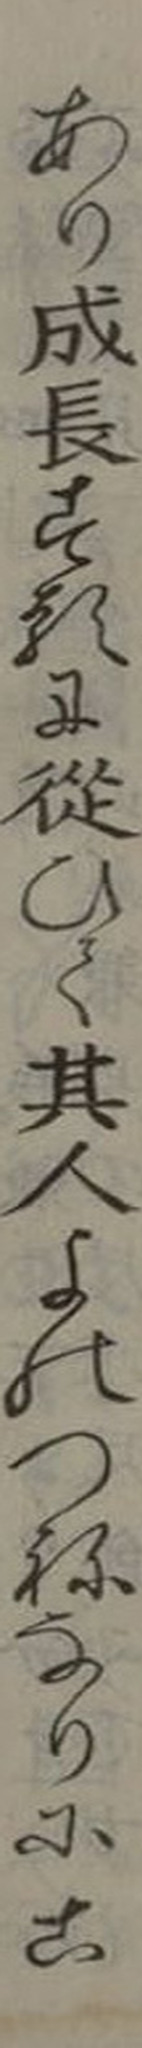あり成長するに從ひて其人よのつねなりにこ
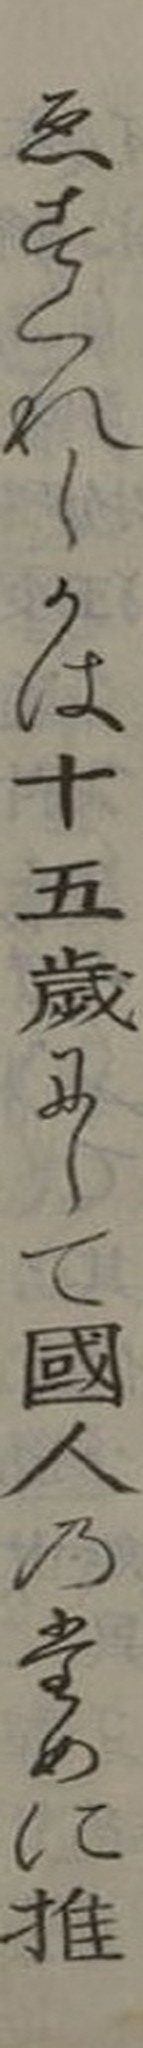ゑすたれしかは十五歲にして國人のために推
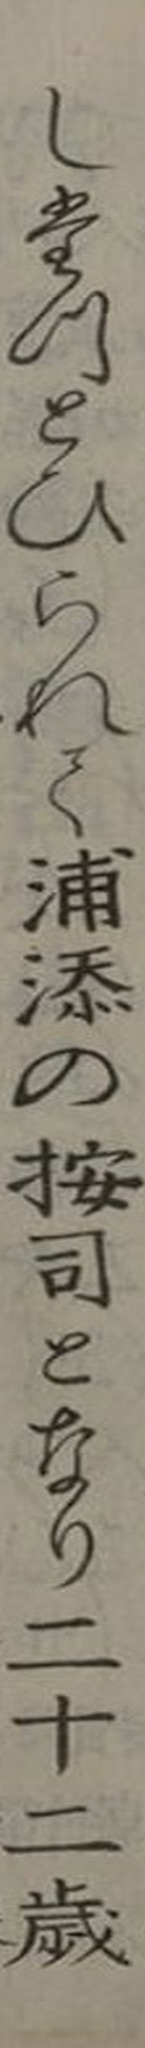したつとひられて浦添の按司となり二十二歳

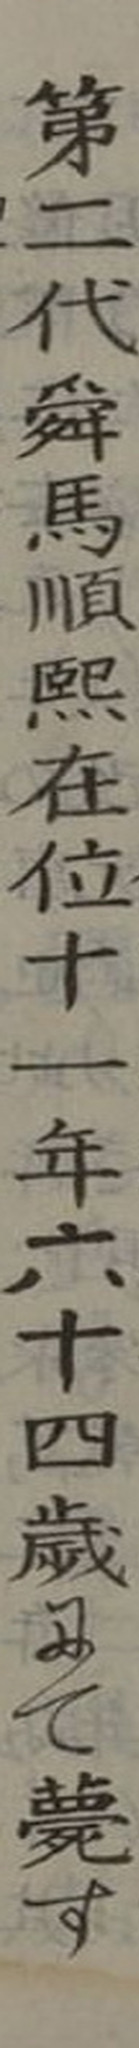第二代舜馬順煕在位十一年六十四歳にて薨す
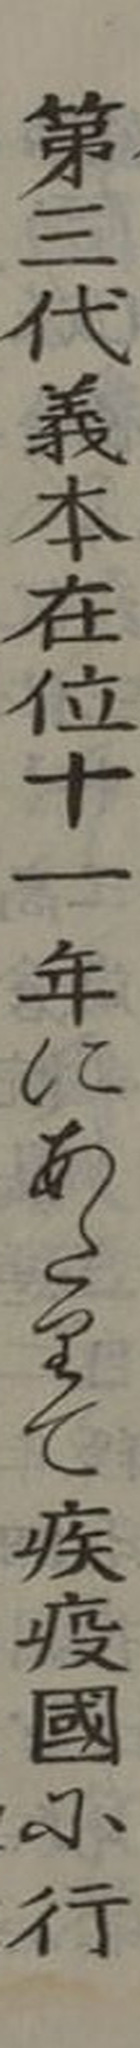第三代義本在位十一年にあたりて疾疫國に行
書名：骨董録
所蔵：University of the Ryukyus Library
